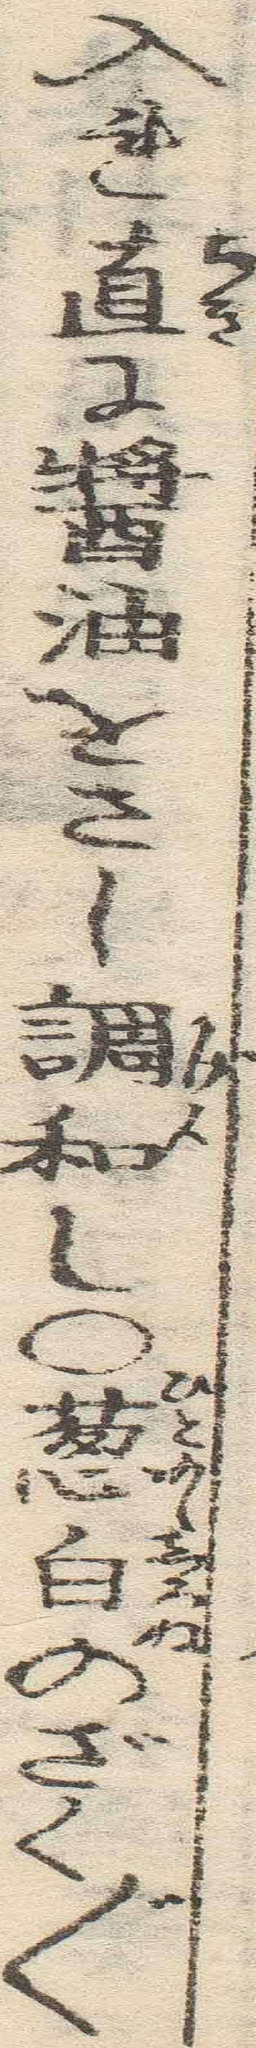入れ直に醤油をさし調和し○葱白のざく〴〵
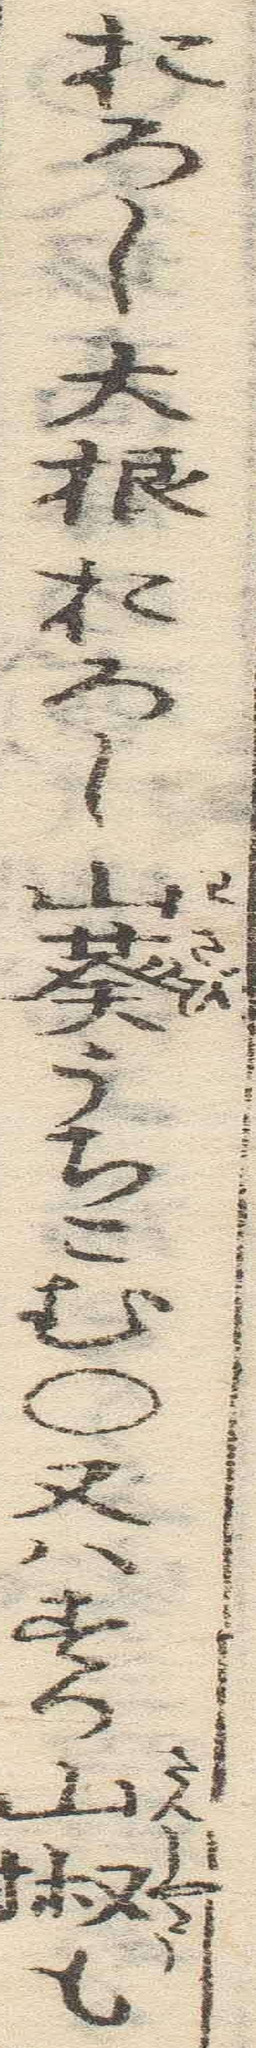おろし大根おろし山葵うちこむ○又はすり山椒も
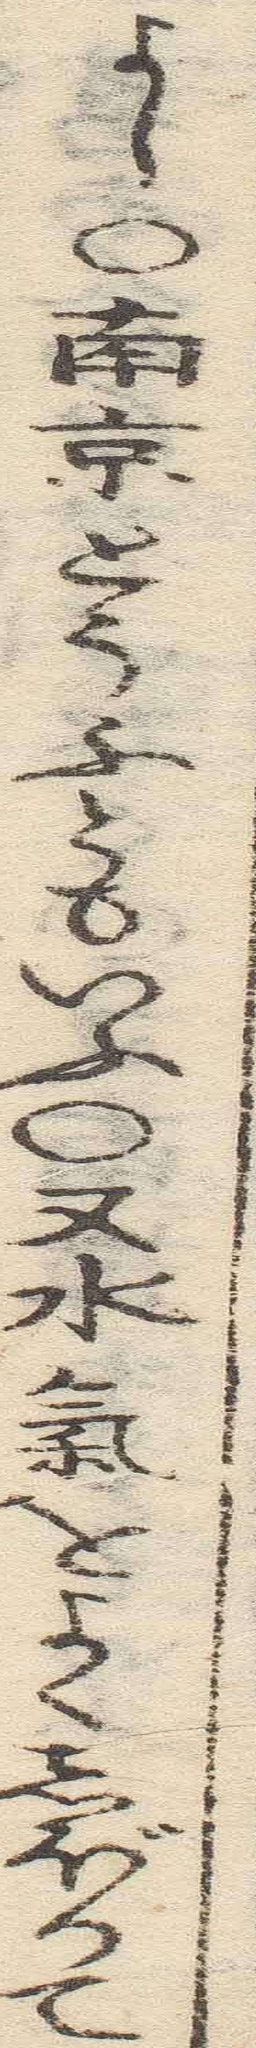よし○南京とうふともいふ○又水気をよくしぼりて
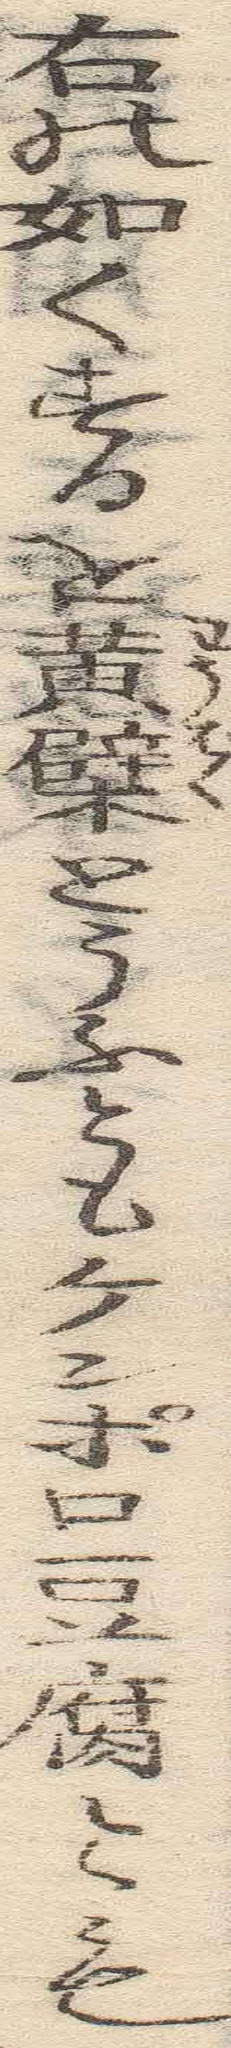右の如くするを黄檗とうふともケンポロ豆腐とも
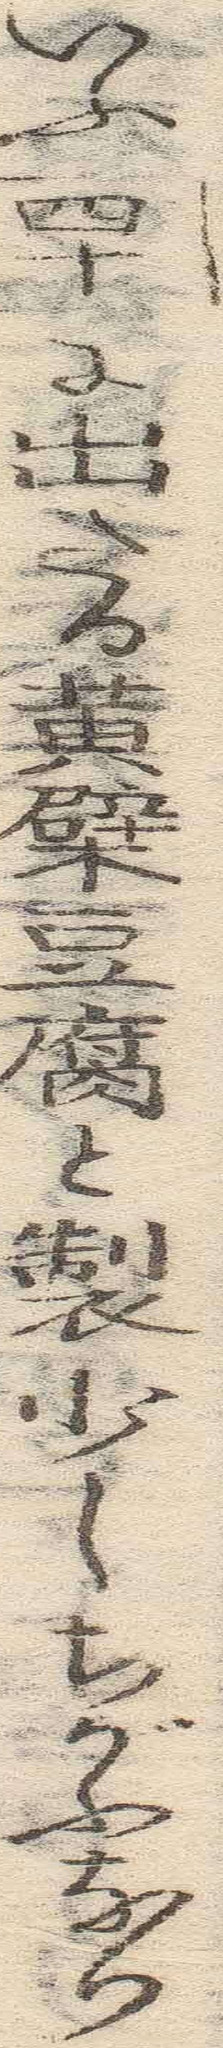いふ[四十]に出たる黄檗豆腐と製少しちがふなり
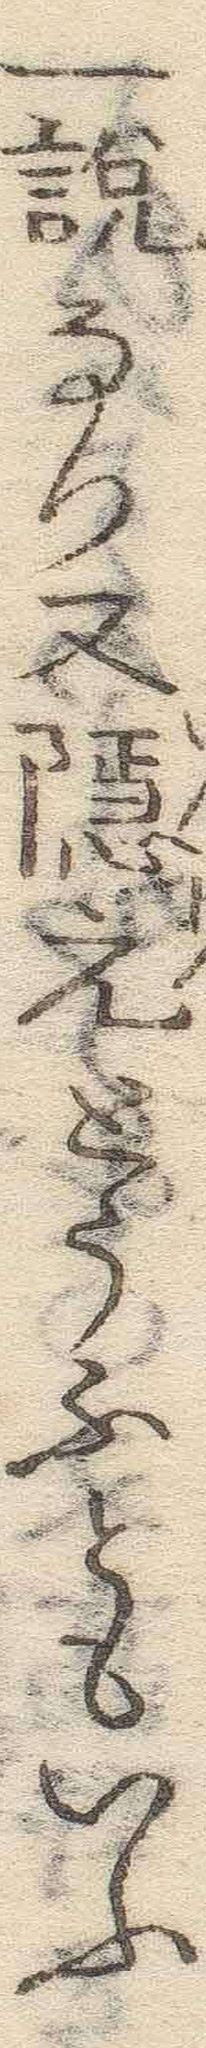一説なり又隠元とうふともいふ
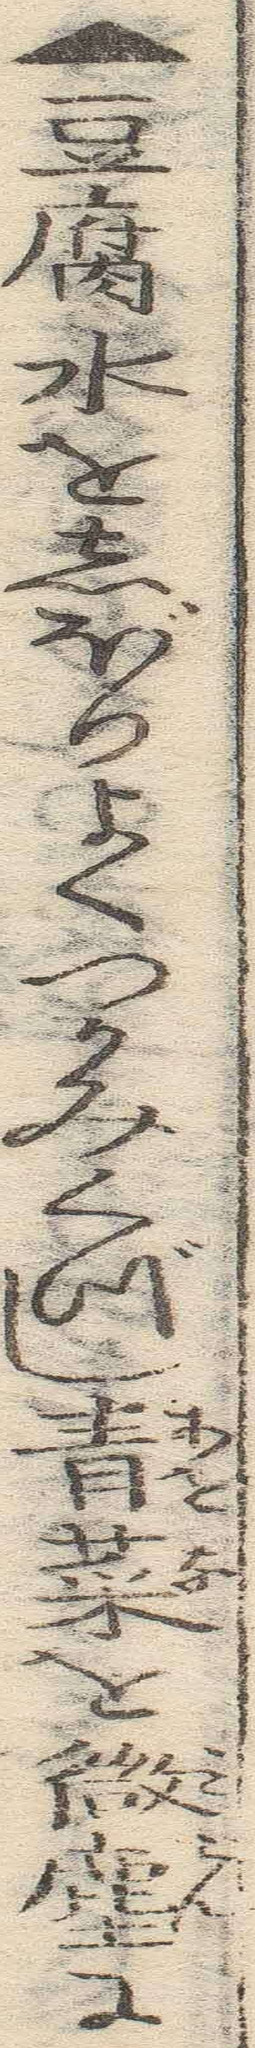▲豆腐水をしぼりよくつかみくづし青菜を微塵に
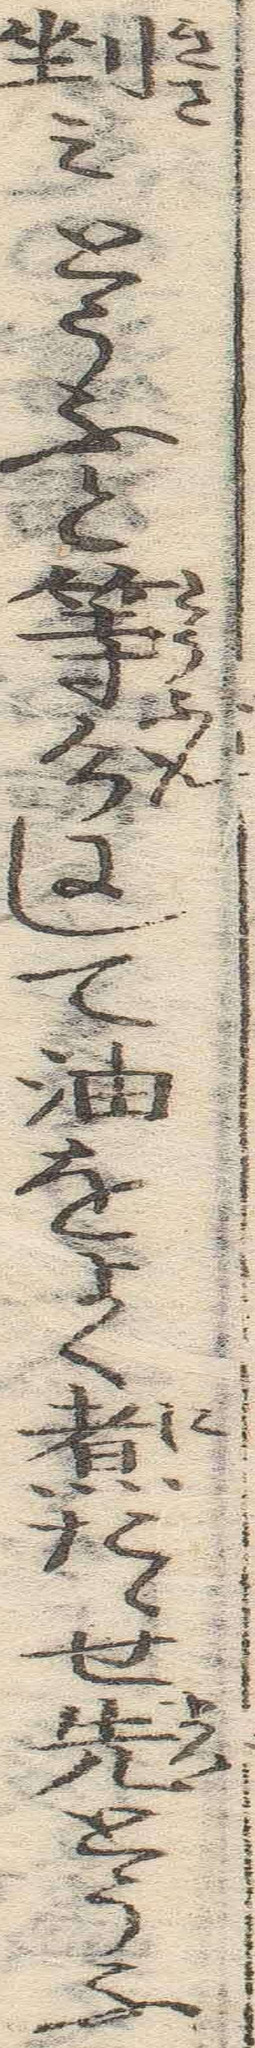刻みとうふと等分にして油をよく煮たゝせ先とうふ
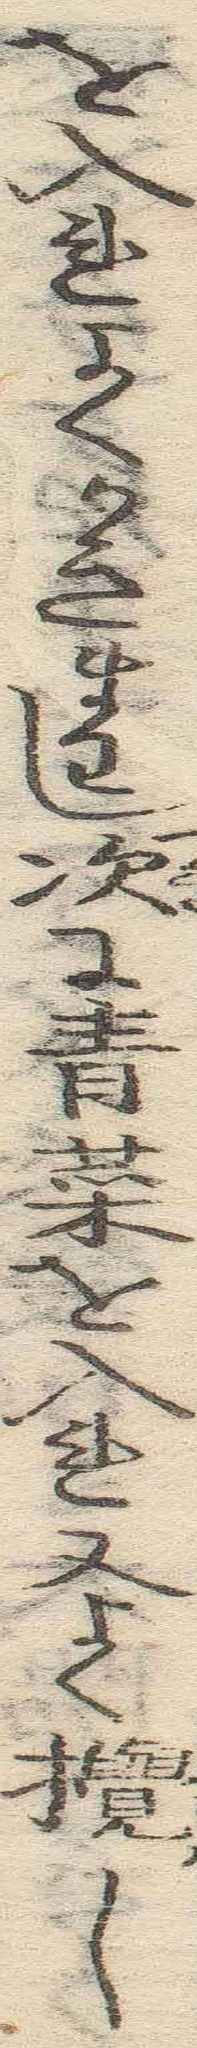を入れよくかきまわし次に青菜を入れ又よく攪し
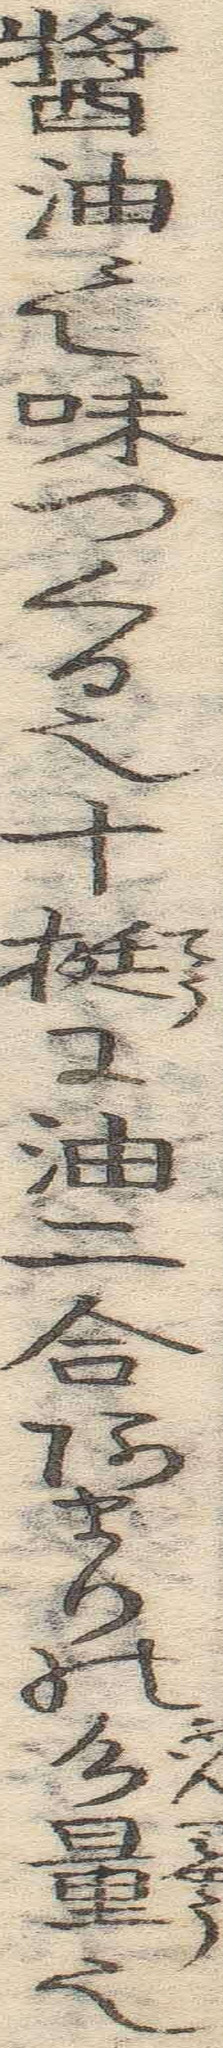醤油にて味つくる也十挺に油二合あまりの分量也
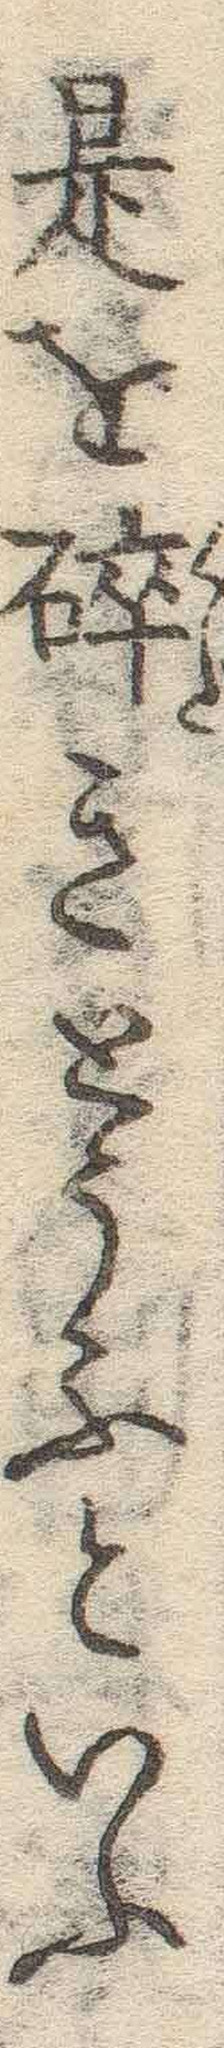是を碎きとうふといふ

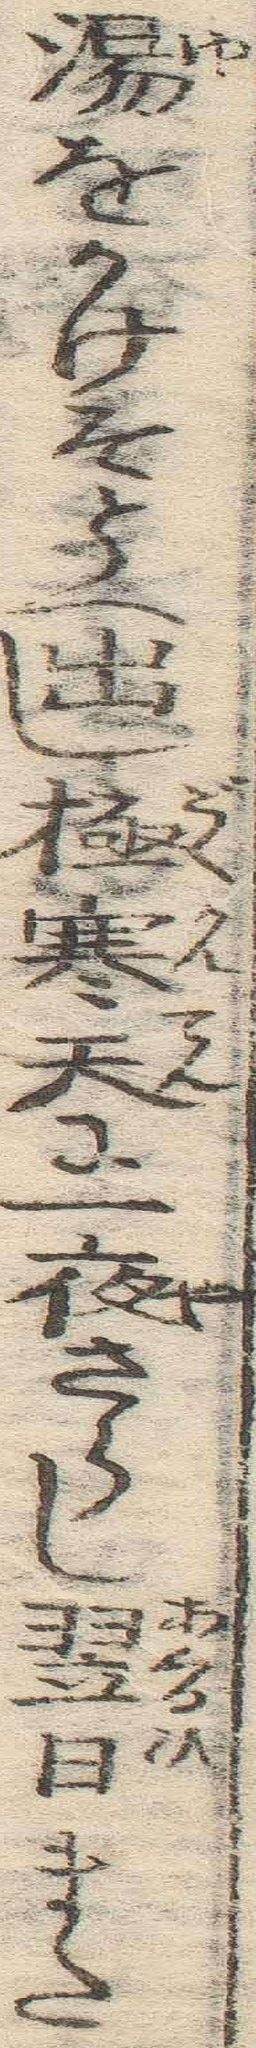湯をかけそとへ出し極寒天に一夜さらし翌日また
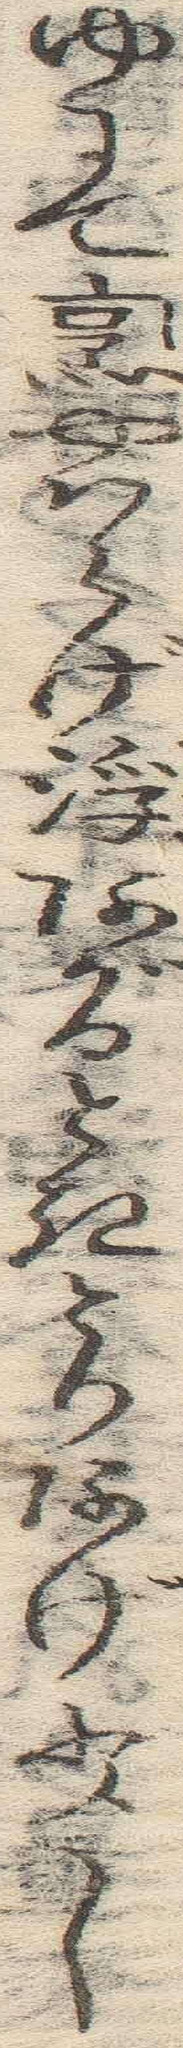ゆにて烹やはらげ浮あがるときとりあげ少し
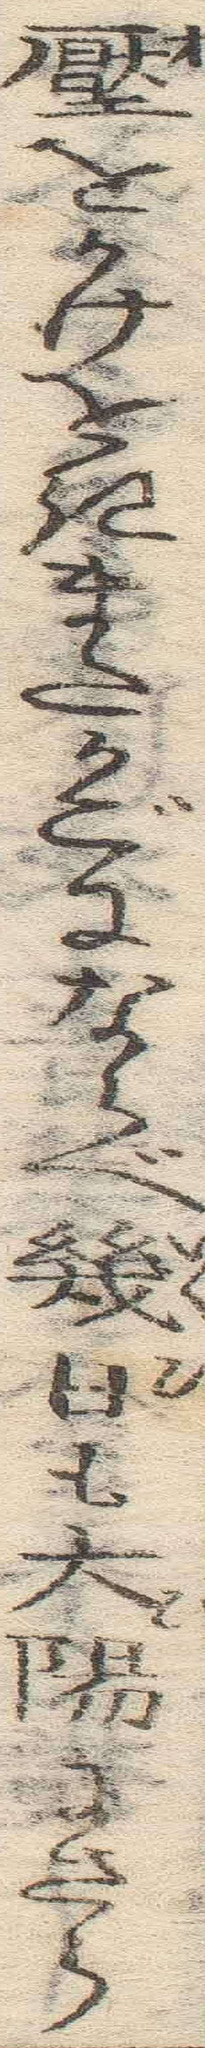壓をかけをきまたかごにならべ幾日も大陽にさら
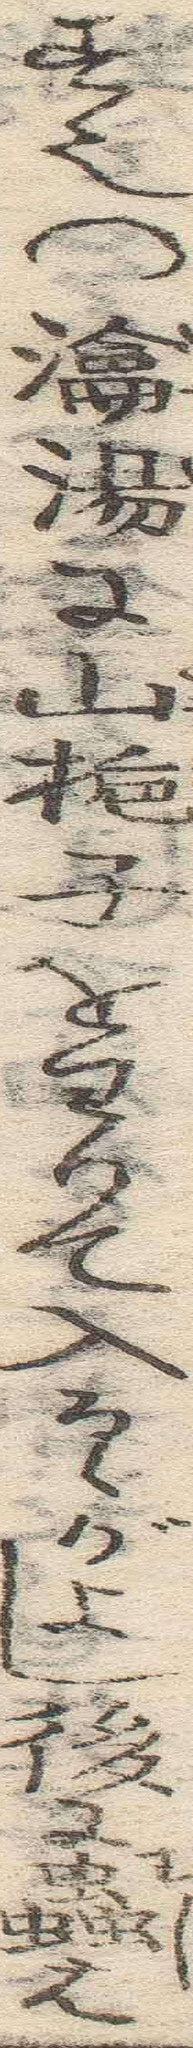す也○瀹湯に山梔子をわりて入るゝがよし後に虫は
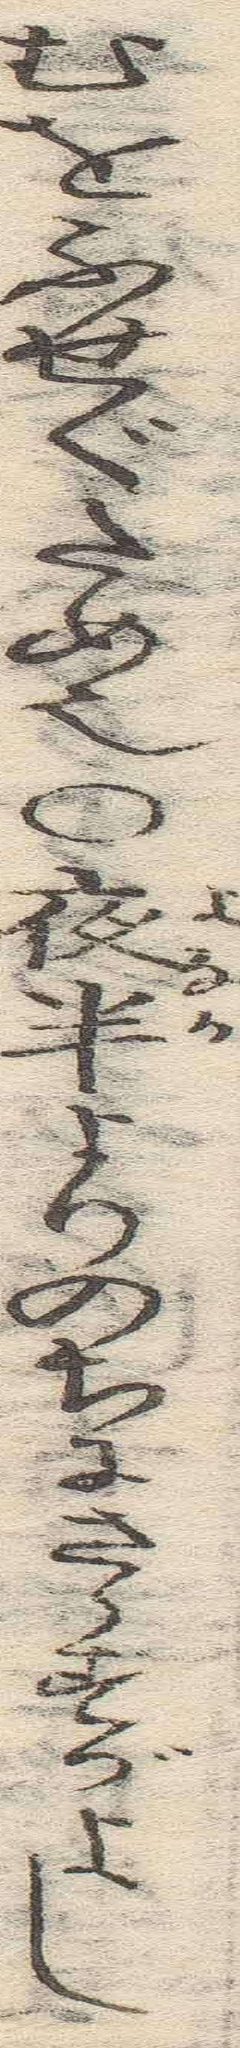むをふせぐため也○夜半よりのちにさらすがよし
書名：豆腐百珍
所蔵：東京学芸大学附属図書館 国文学研究資料館
